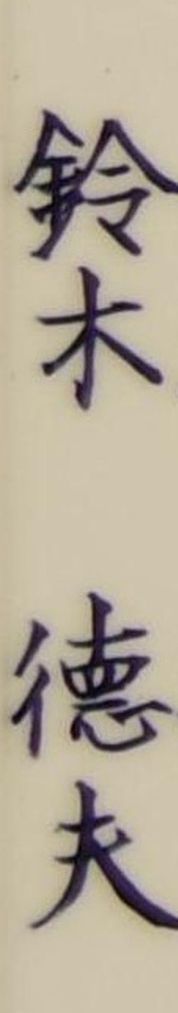鈴木徳夫

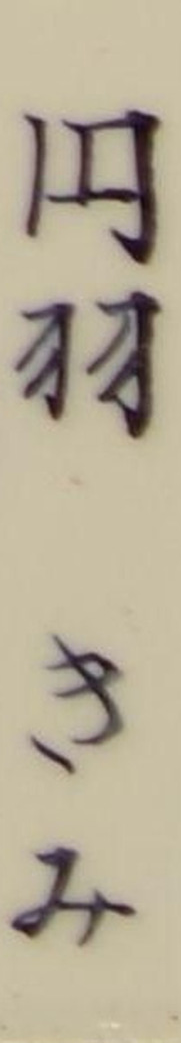円羽きみ
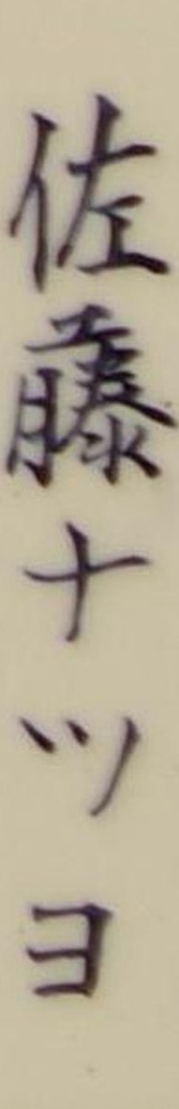佐藤ナツヨ
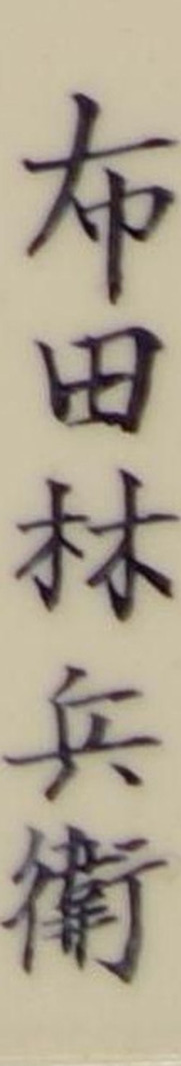布田林兵衛
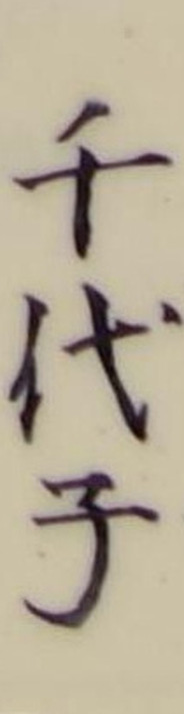千代子
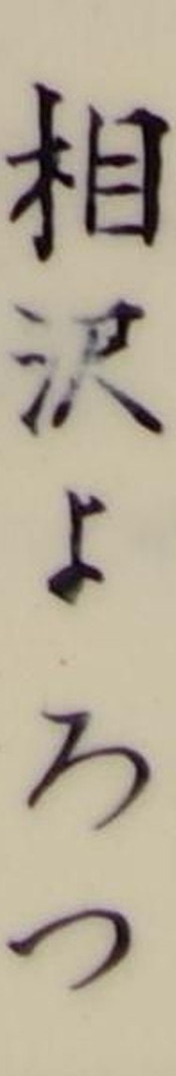相沢よろつ
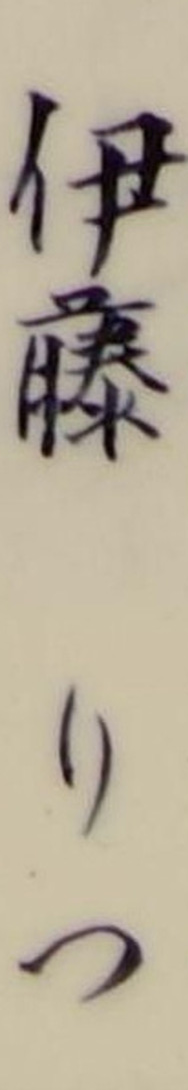伊藤りつ
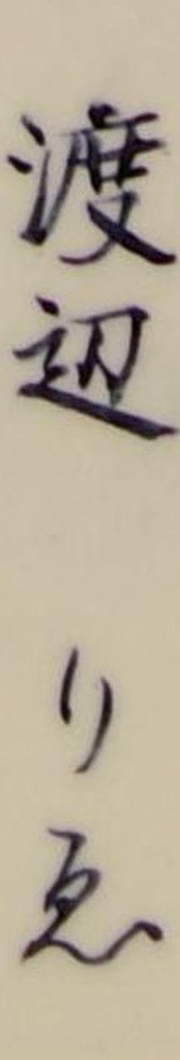渡辺りゑ
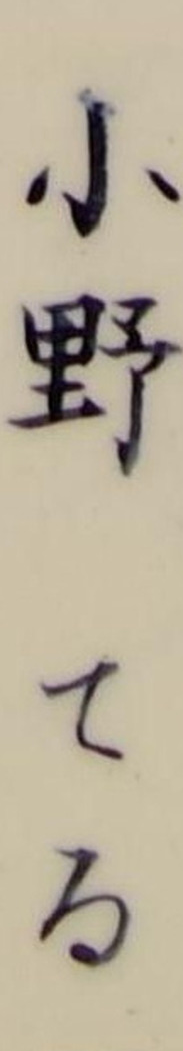小野てる
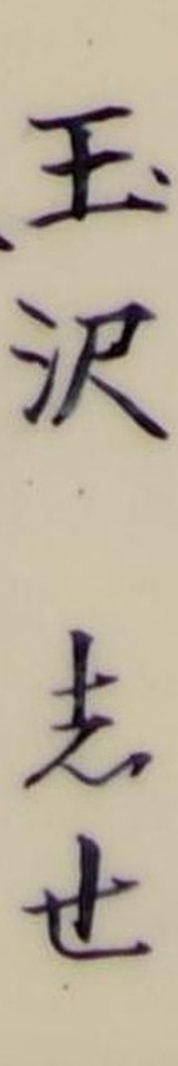玉沢しせ
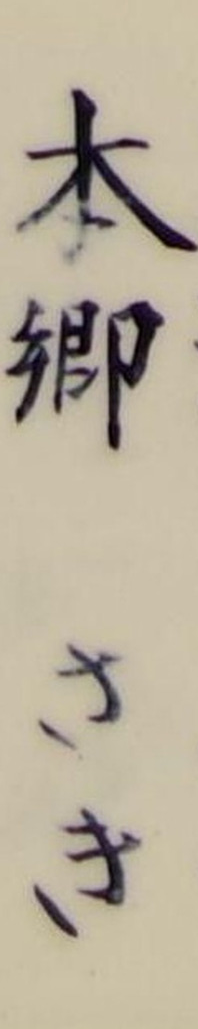本郷さき
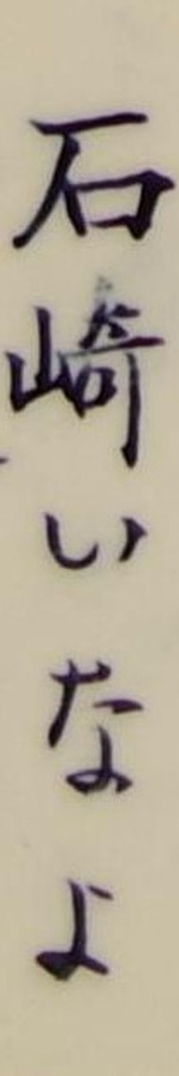石崎いなよ
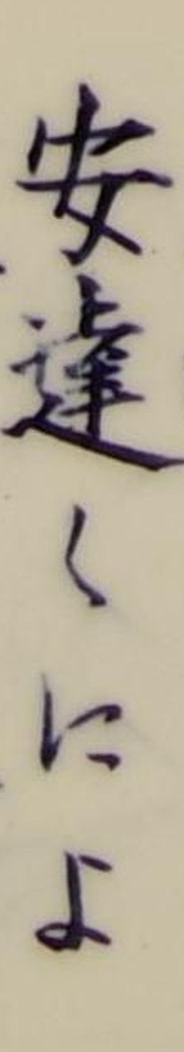安達くによ
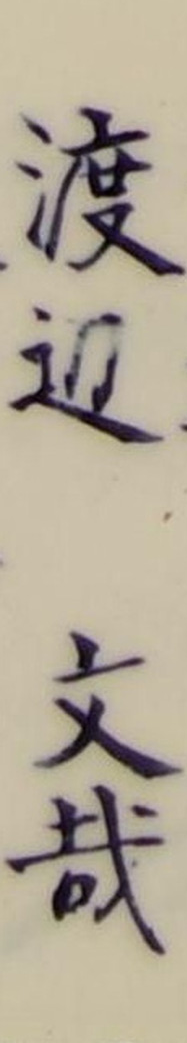渡辺文哉
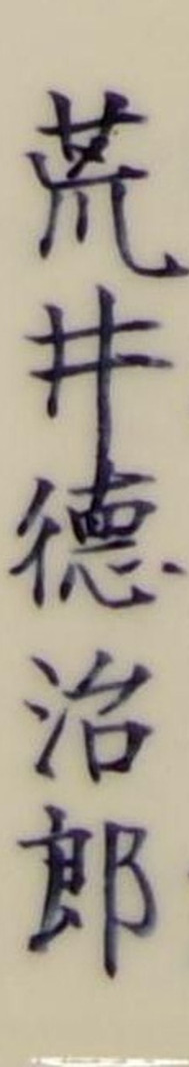荒井徳治郎
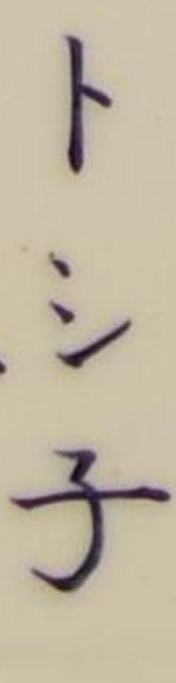トシ子
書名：A~D
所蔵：koyasan kongobuji
